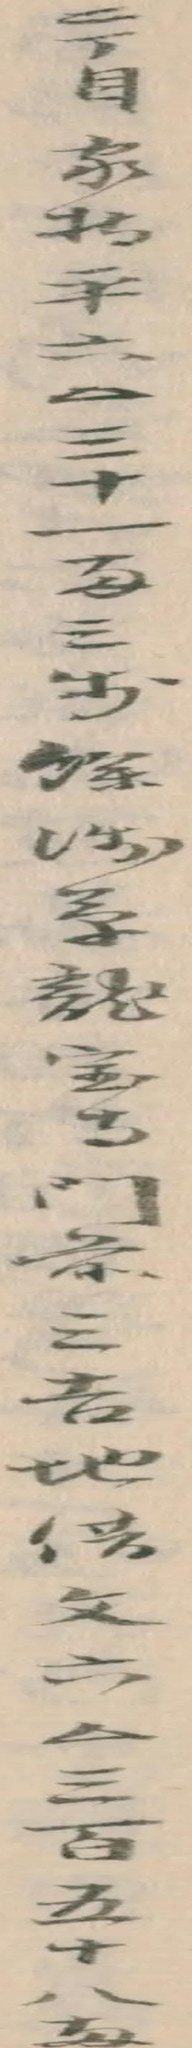二丁目家持平六△三十一両三歩余浅草龍宝寺門前三吉地借文六△三百五十八両
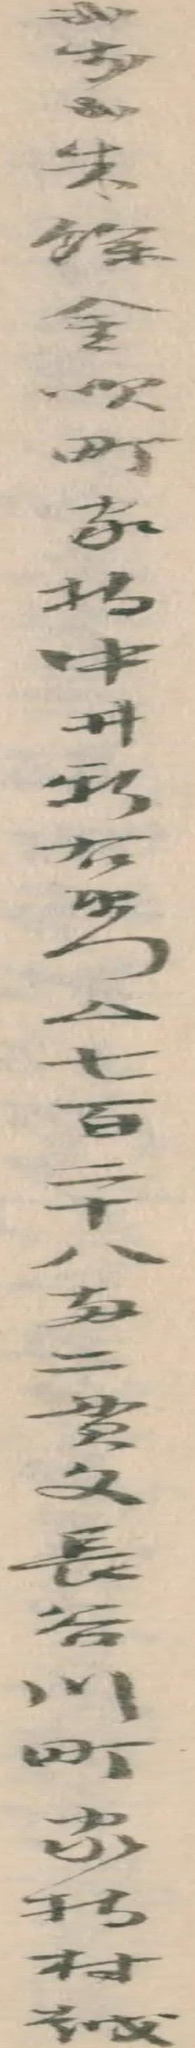弐歩弐朱余金吹町家持中井新右衛門△七百二十八両二貫文長谷川町家持村越
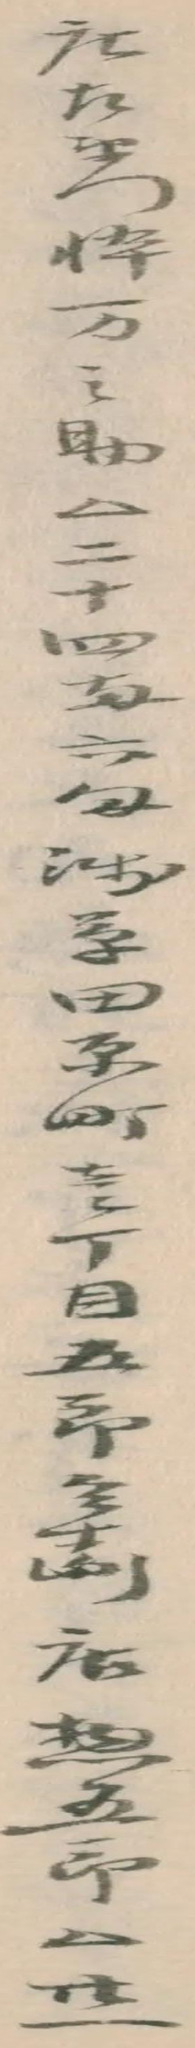庄左衛門忰万之助△二十四両六匁浅草田原町壱丁目五郎兵衛店惣五郎△廿一
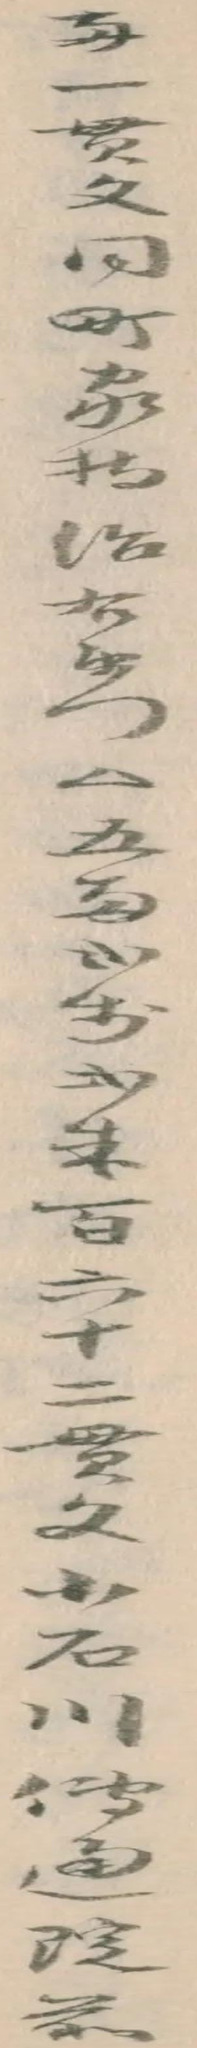両一貫文同町家持治右衛門△五両弐歩弐朱百六十二貫文小石川伝通院前
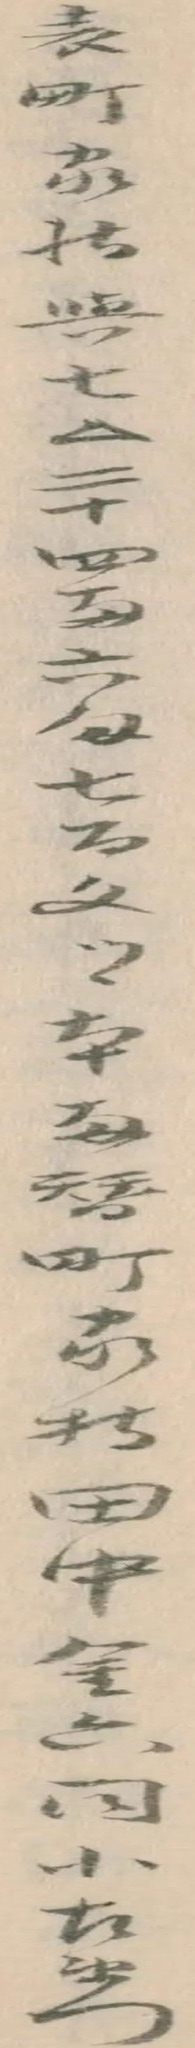表町家持与七△二十四両六匁七百文つゝ本両替町家持田中金六同小左衛門
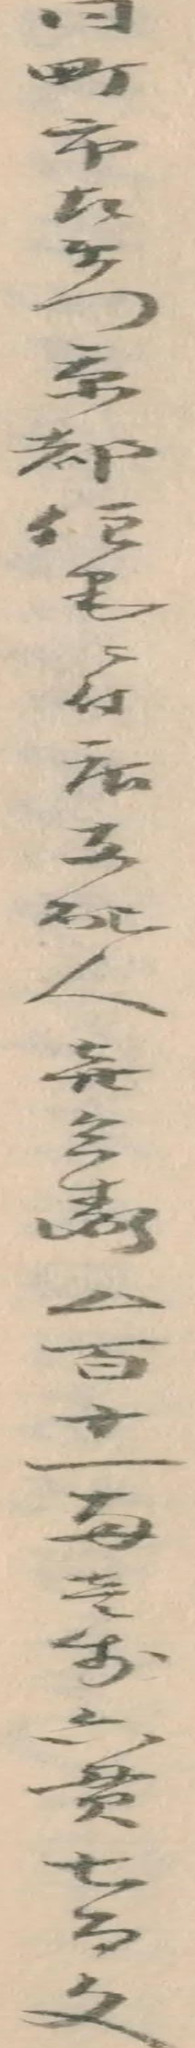同町市左衛門京都住宅付店支配人喜兵衛△百十一両壱歩六貫七百文

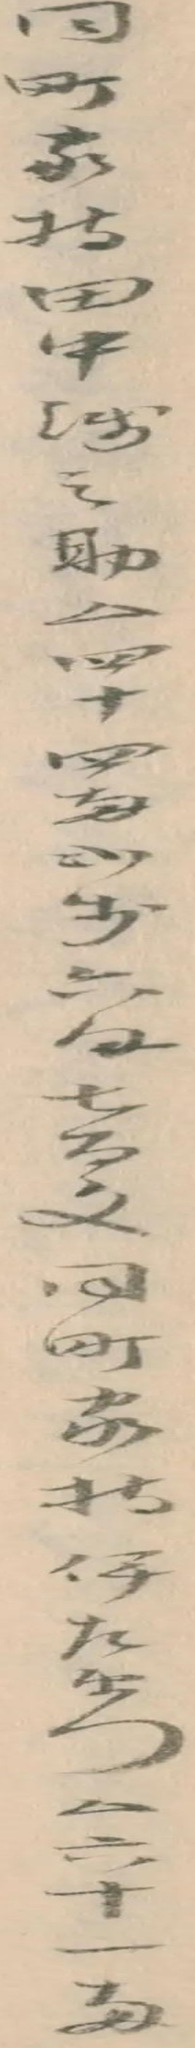同町家持田中浅之助△四十四両弐歩六匁七百文同町家持伊左衛門△六十一両
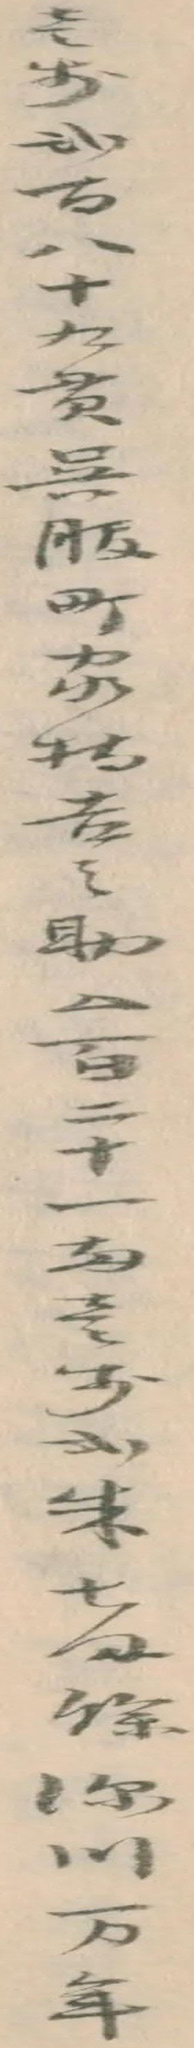壱歩弐百八十九貫呉服町家持吉之助△百二十一両壱歩弐朱七匁余深川万年
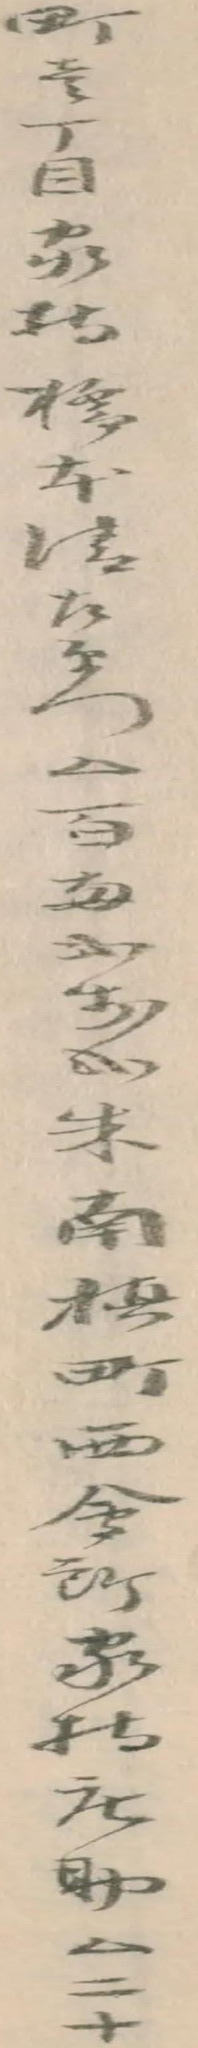町壱丁目家持橋本清左衛門△百両弐歩弐朱南槙町西会所家持庄助△二十
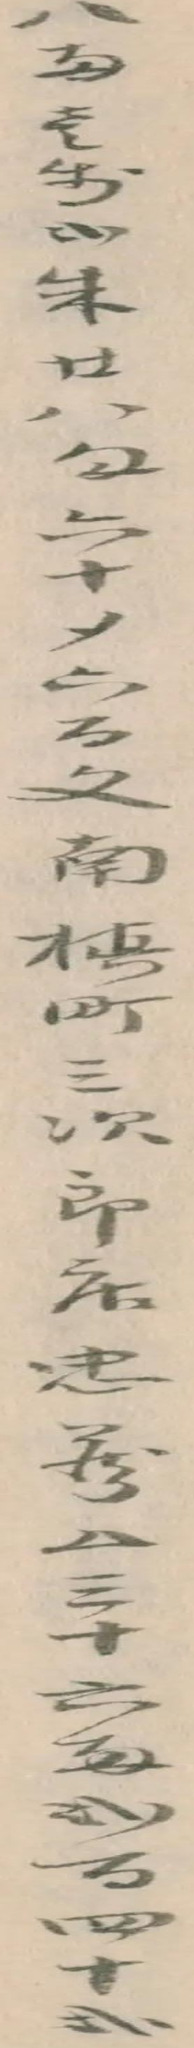八両壱歩弐朱廿八匁六十貫六百文南槙町三次郎店忠蔵△三十六両弐百四十弐
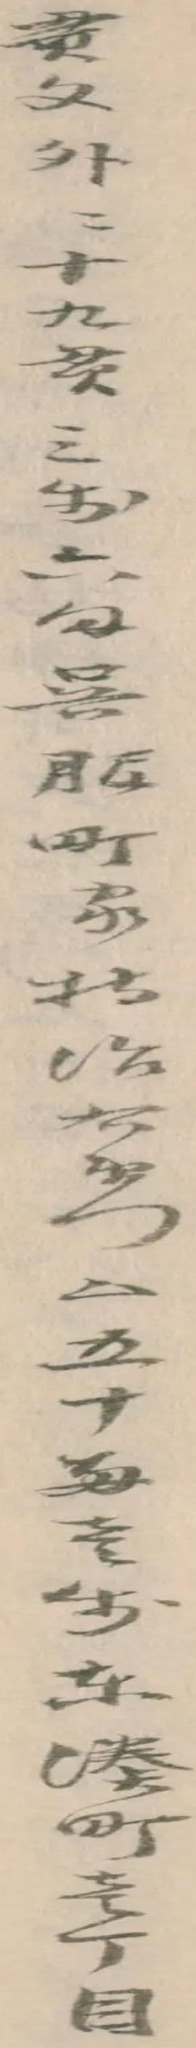貫文外に十九貫三歩六匁呉服町家持治右衛門△五十両壱歩東湊町壱丁目
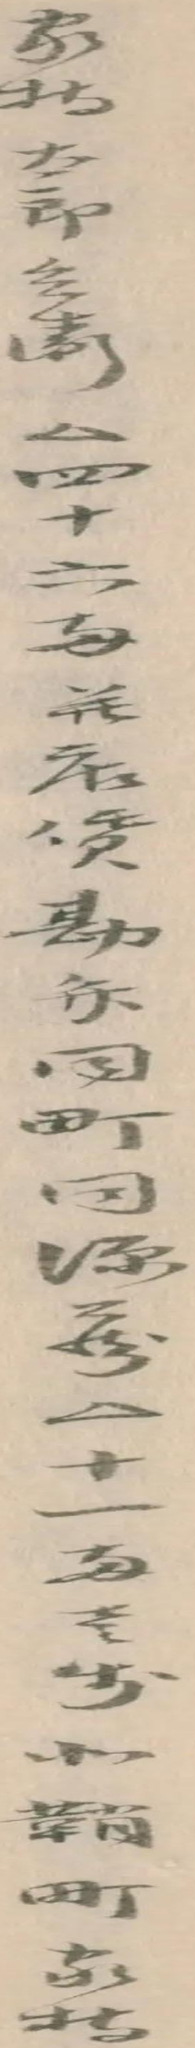家持太郎兵衛△四十六両并店賃勘弁同町同源蔵△十一両壱歩北鞘町家持
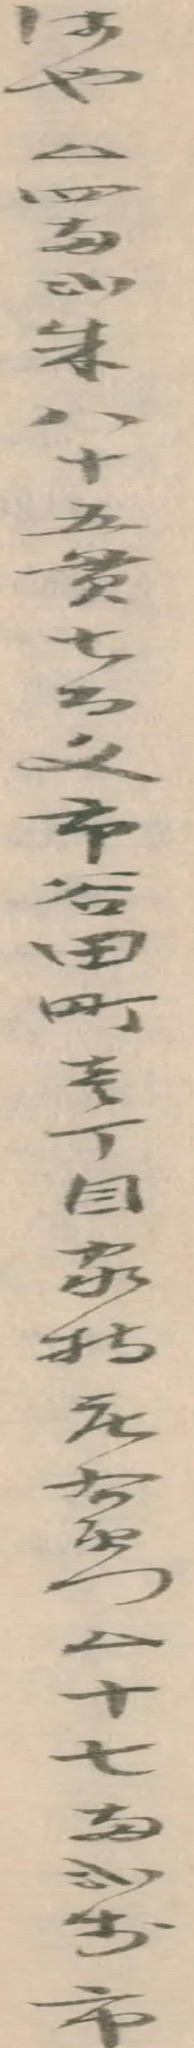はや△四両弐朱八十五貫七百文市谷田町壱丁目家持庄右衛門△十七両二歩市
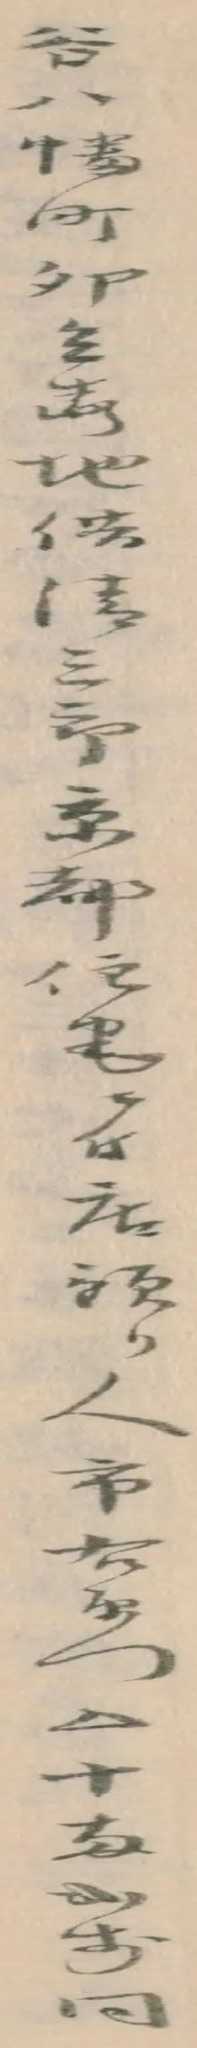谷八幡町卯兵衛地借清三郎京都住宅付店預り人市右衛門△十両弐歩同
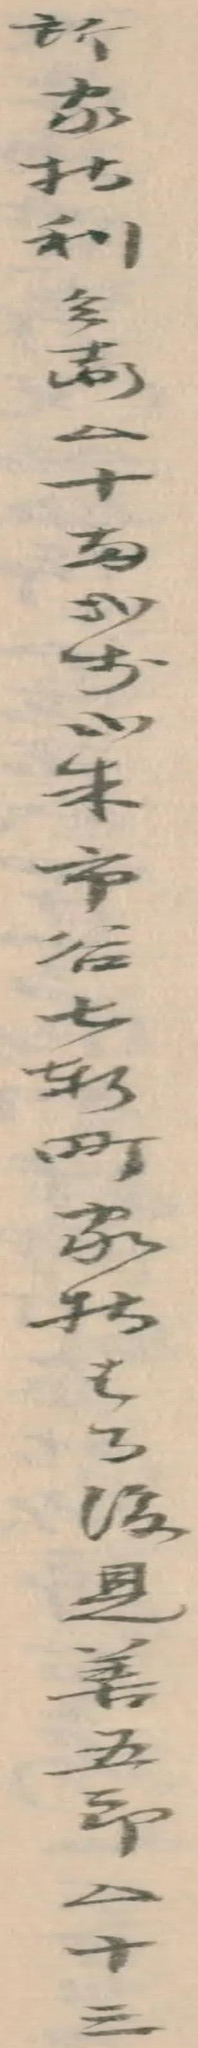所家持利兵衛△十両弐歩弐朱市谷七軒町家持はる後見善五郎△十三
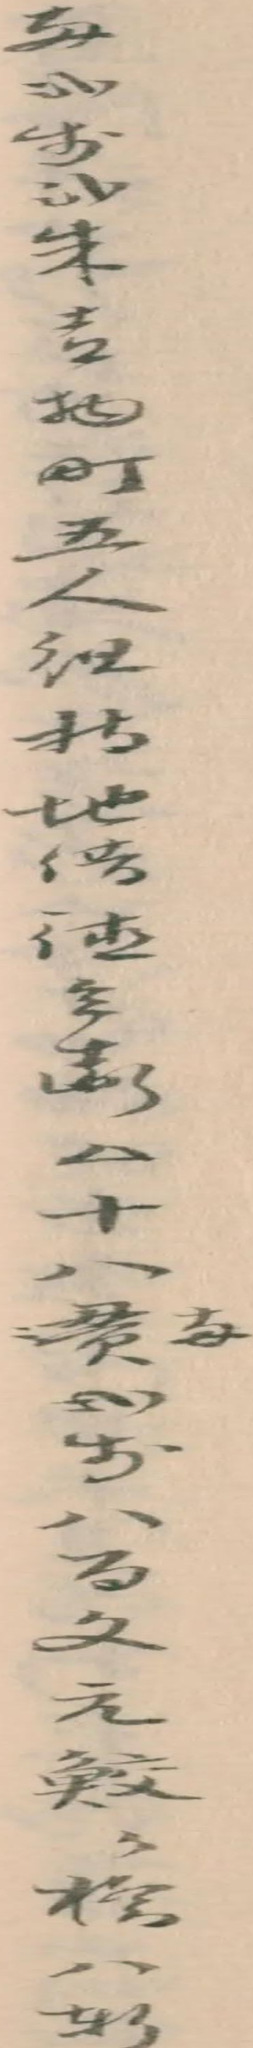両弐歩弐朱青物町五人組持地借徳兵衛△十八貫弐歩八百文元鮫ケ橋八軒
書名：地災撮要. 巻10(地震之部) 上,下
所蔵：国立国会図書館 National Diet Library, JAPAN
